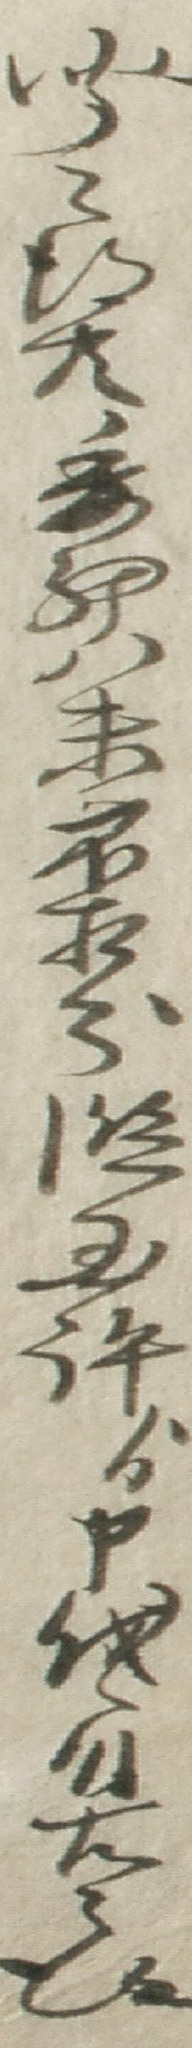聞候得共委細ハ未不相分段国許ゟ申越候付右之趣
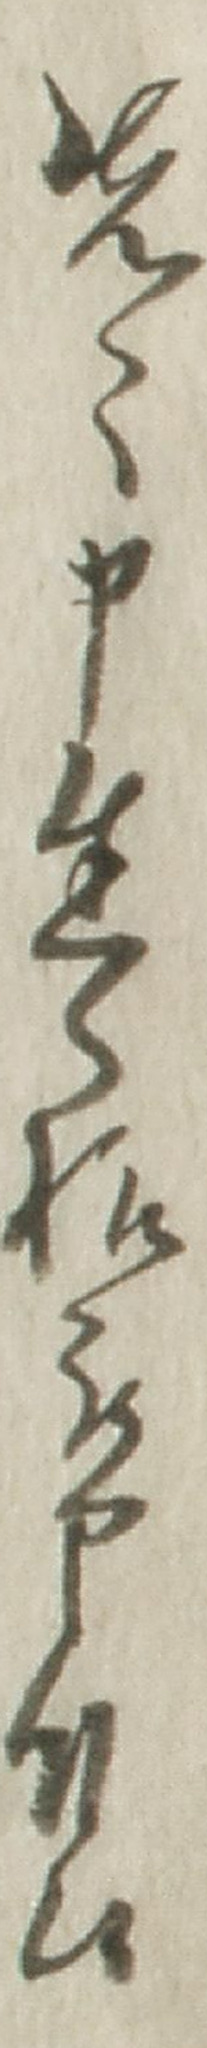先々申達候様申付候
